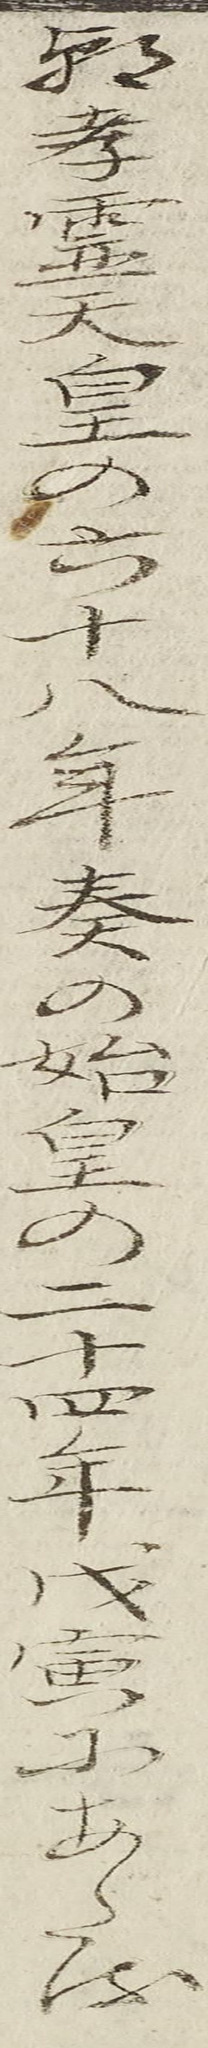朝孝霊天皇の六十八年秦の始皇の二十四年戌寅にあたる
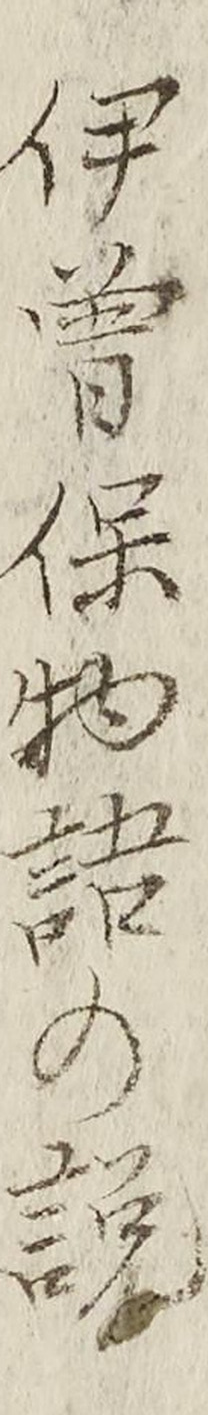伊曽保物語の説
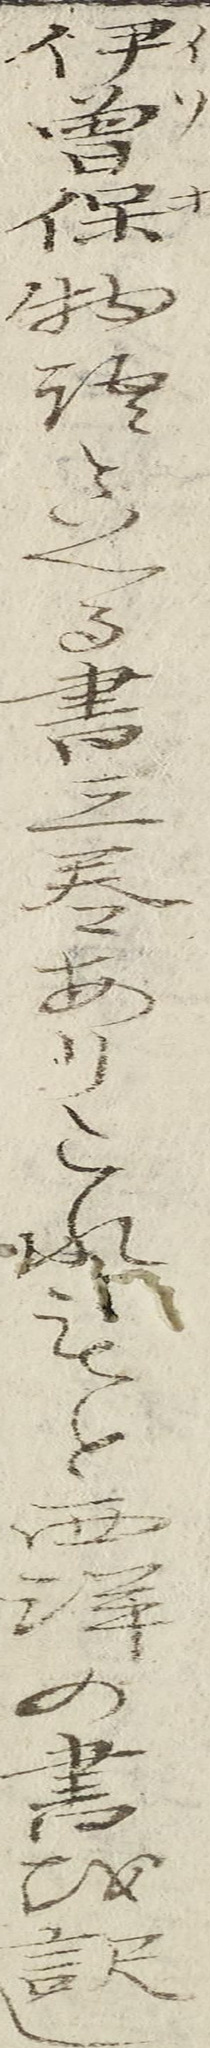伊曽保物語といへる書三巻ありこれもと西洋の書を訳し
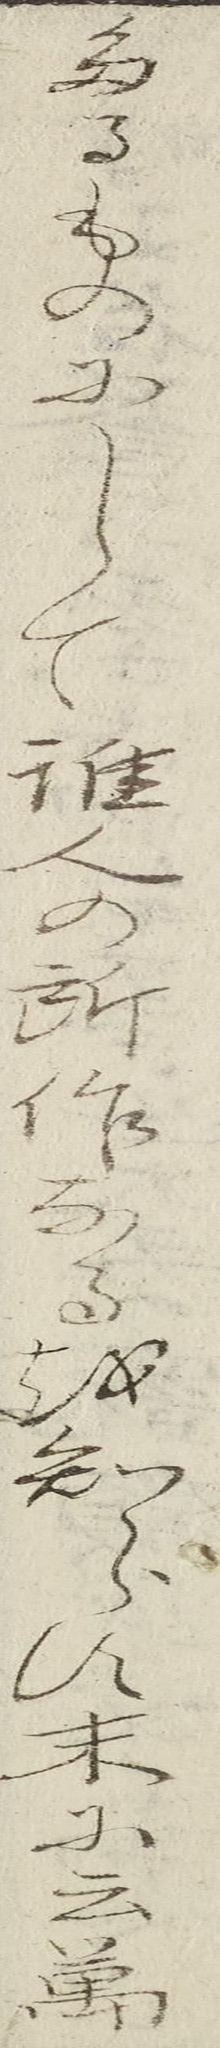たるものにして誰人の所作なるを知らす末に云萬
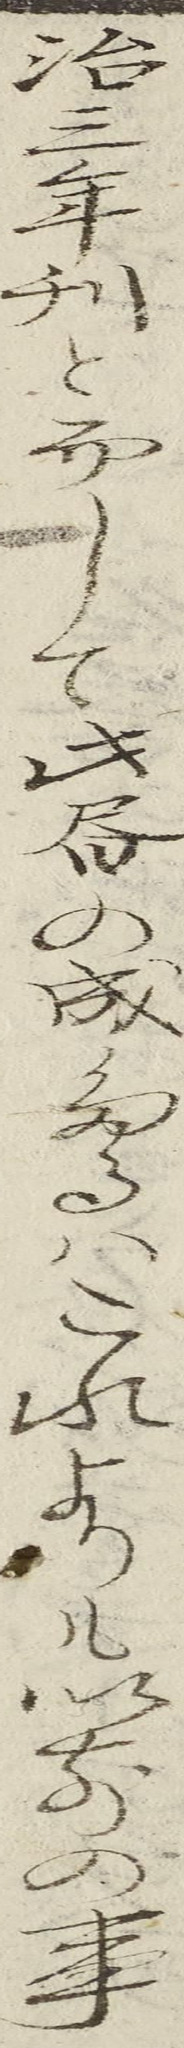治三年刊と而して此書の成たるはこれよりも以前の事
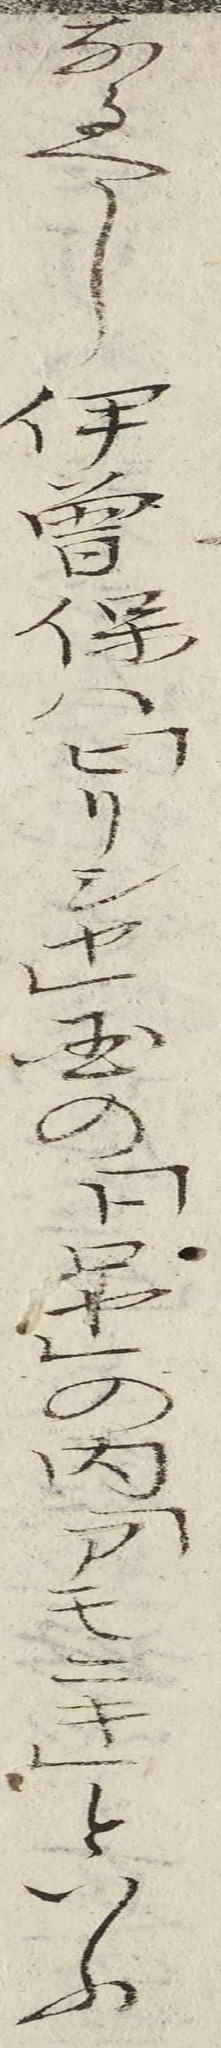なるへし伊曽保は「ヒリシヤ」国の「トロヤ」の内「アモ二キ」といふ
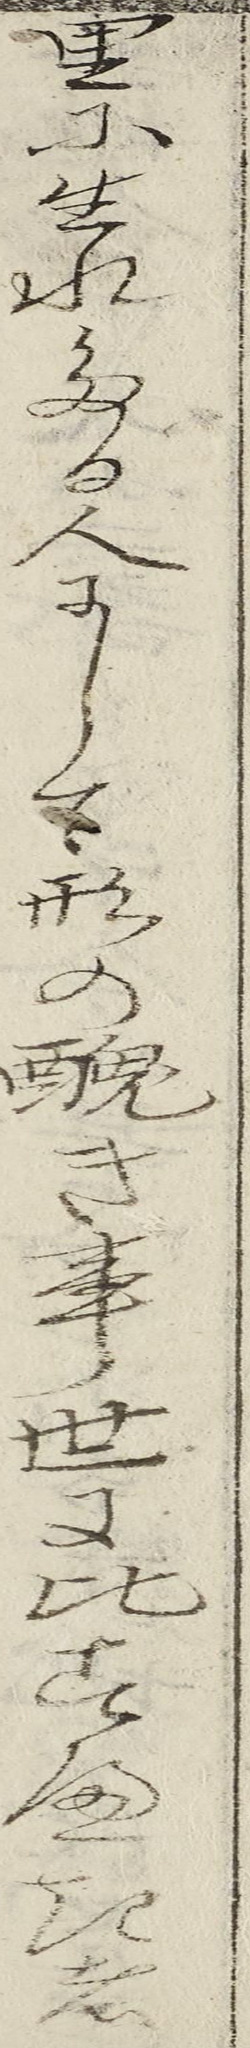里に生れたる人にして形の醜き事世に比すへき者
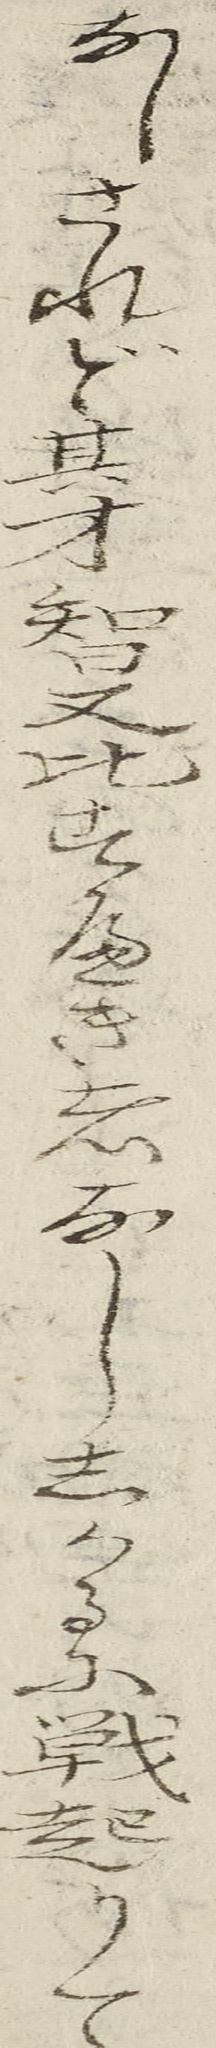なしされど其才智又比すへき者なししかるに戦起りて
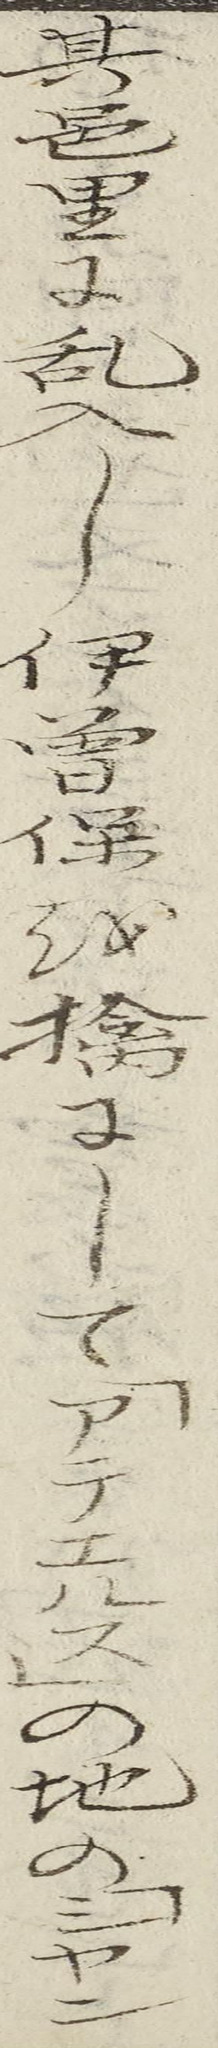其邑里に乱入し伊曽保を擒にして「アテエルス」の地の「シヤン
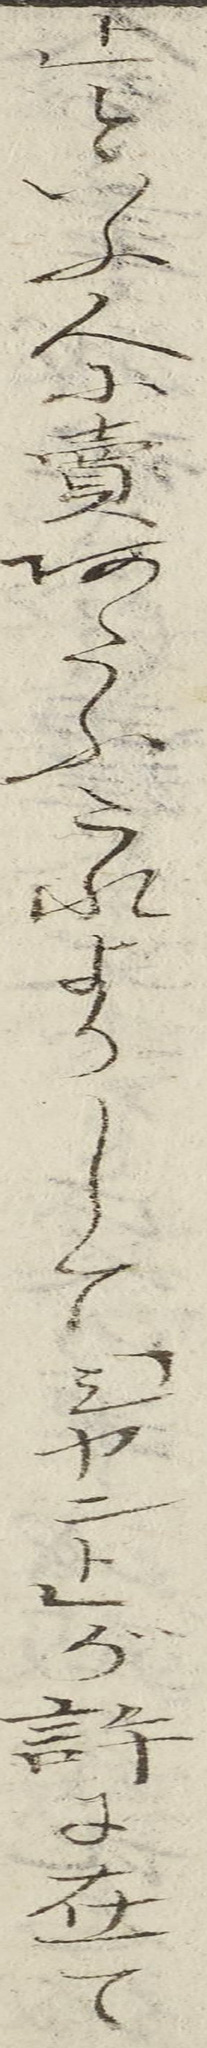ト」といふ人に売あたふこれよりして「シヤント」が許に在て
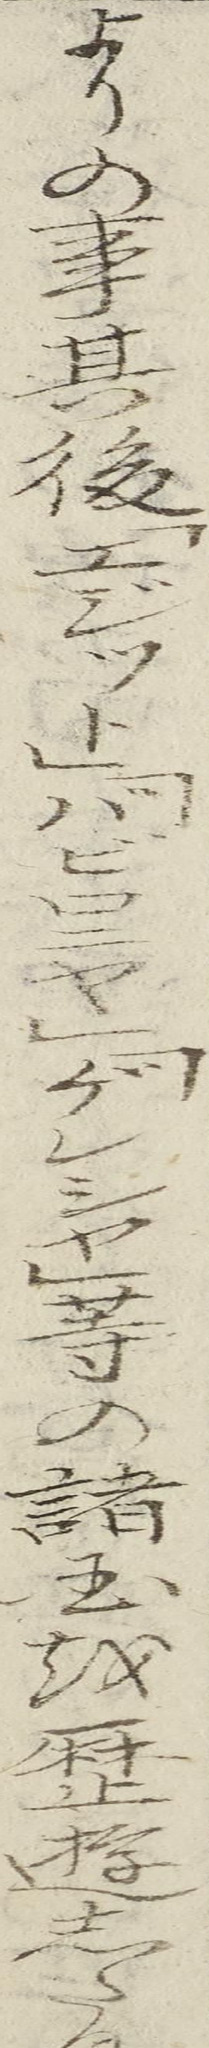よりの事其後「エジット」「バビロ二ヤ」「ゲンシヤ」等の諸国を歴遊したる
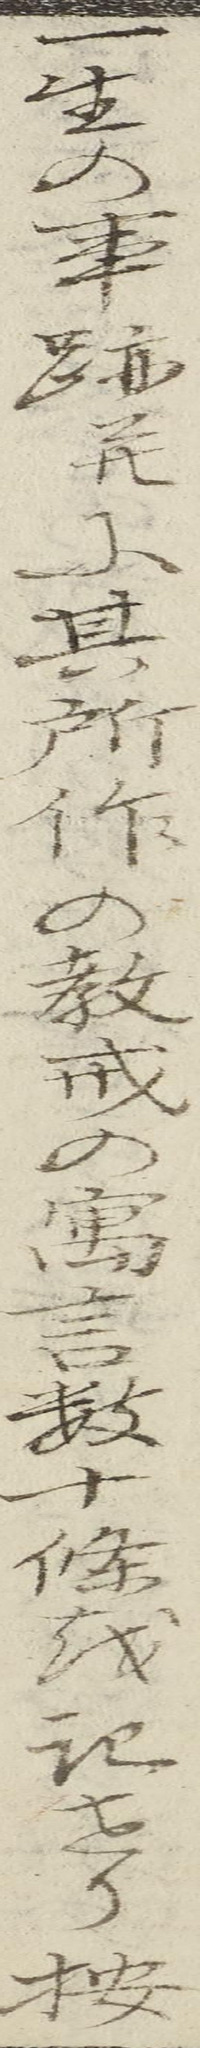一生の事跡幷に其所作の教戒の寓言数十条を記せり按
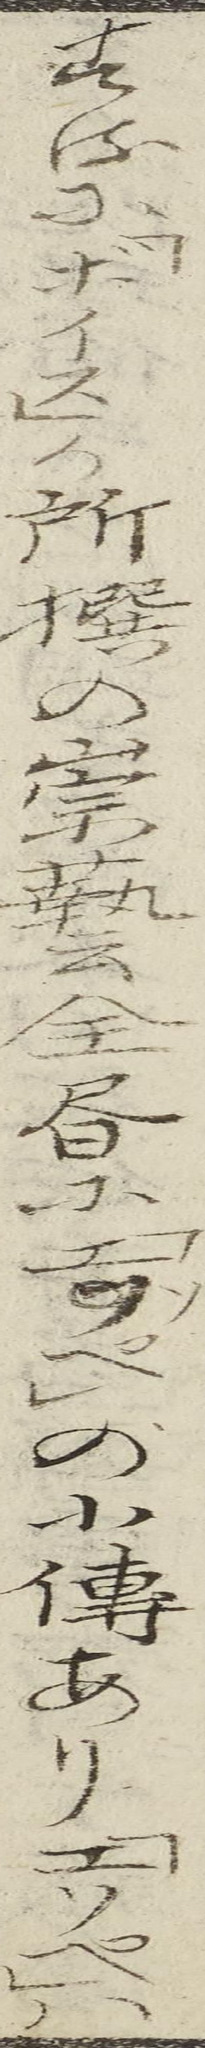するに「ボイス」が所撰の崇芸全書に「エソぺ」の小伝あり「エソぺ」は

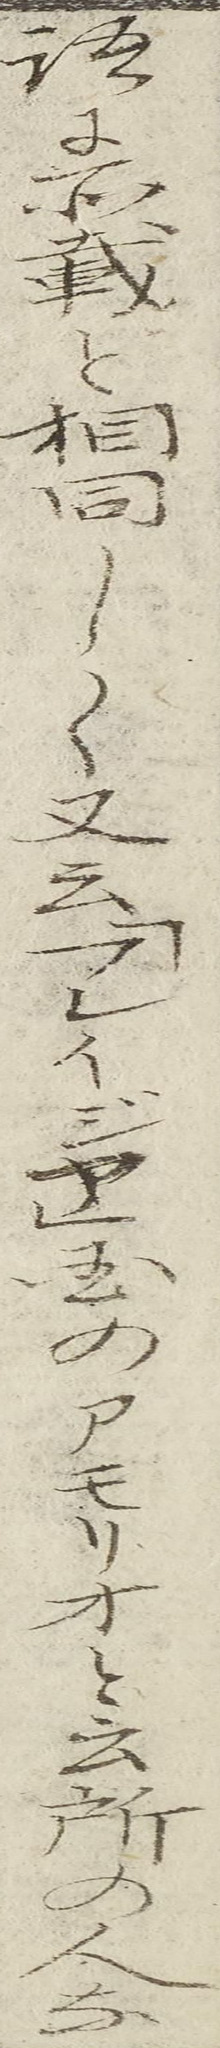語に所載と相同しく又云「フレイジア」国のアモリオと云所の人な
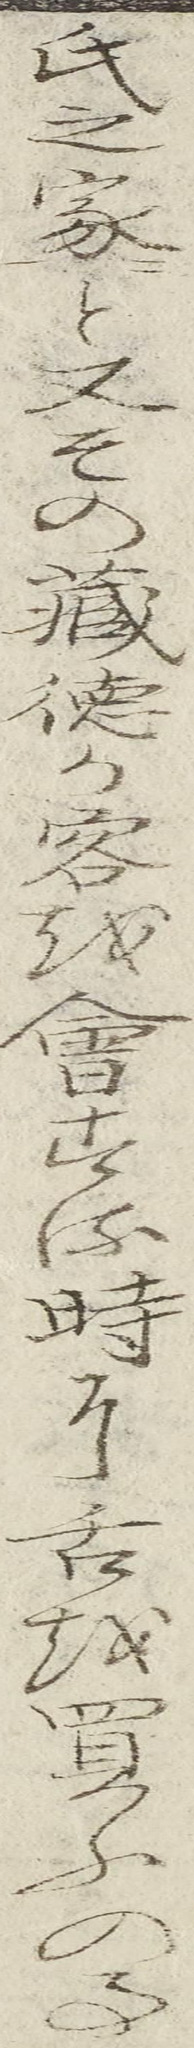氏之家二と又その蔵徳か客を会する時に舌を買ふの事
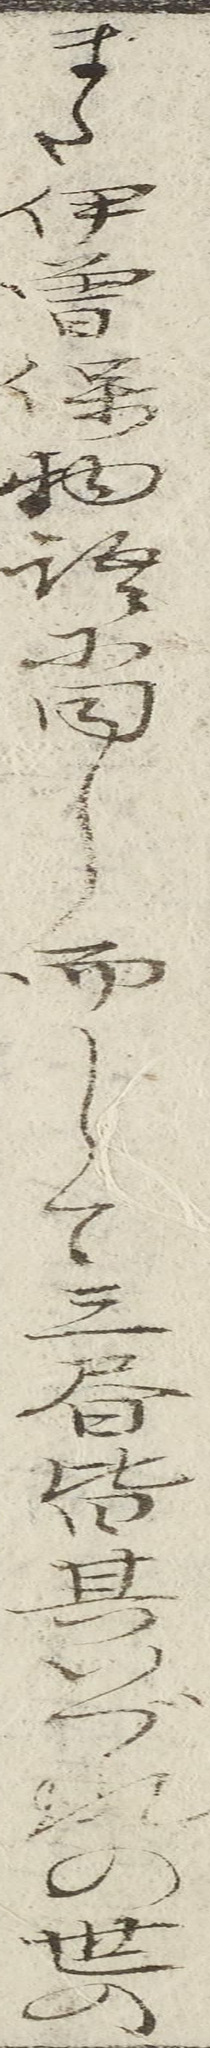また伊曽保物語に因し而して三書皆其いづれの世の
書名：西洋雜記　乾
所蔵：東京大学地震研究所図書室 Earthquake Research Institute Library, The University of Tokyo, JAPAN
